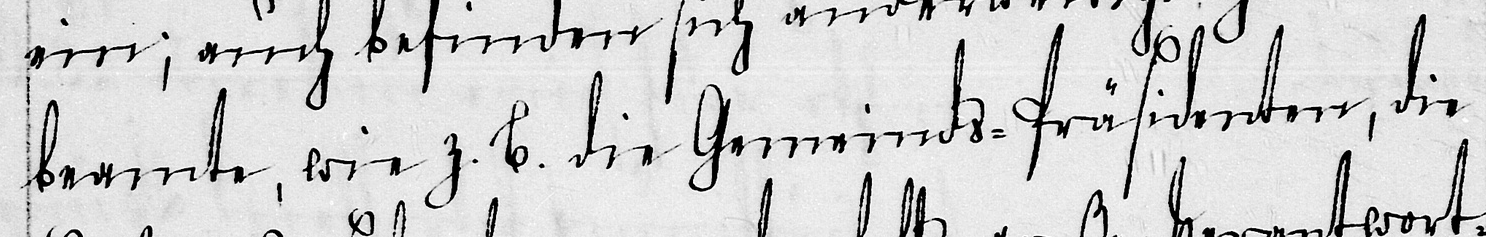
beamte, wie z. B. die Gemeinds-Präsidenten, die
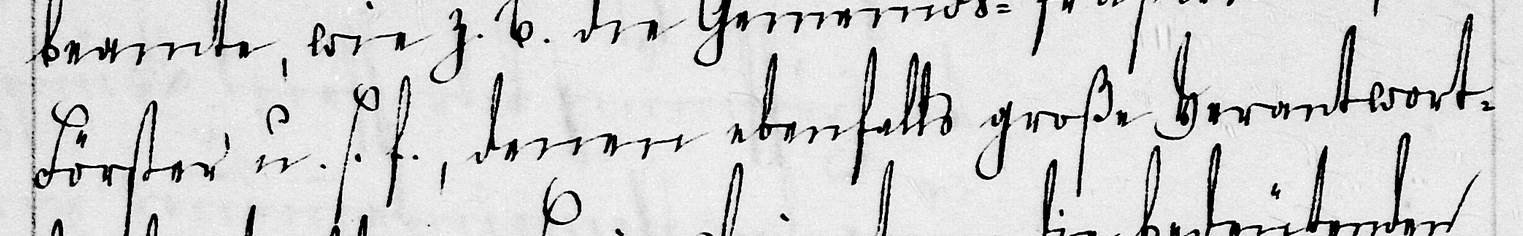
Förster u. s. f., denen ebenfalls große Verantwort¬
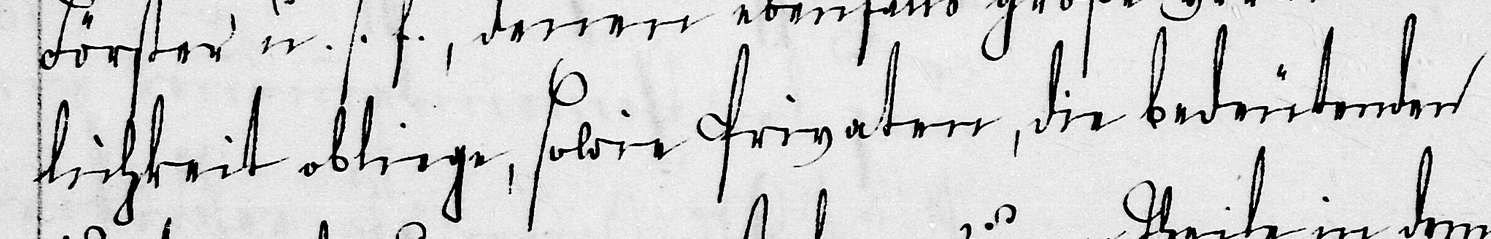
lichkeit obliege, sowie Privaten, die bedeutenden
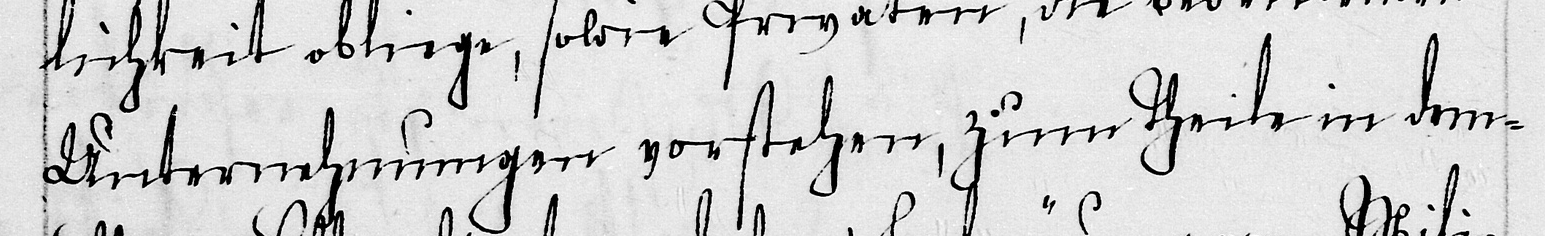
Unternehmungen vorstehen, zum Theile in dem¬
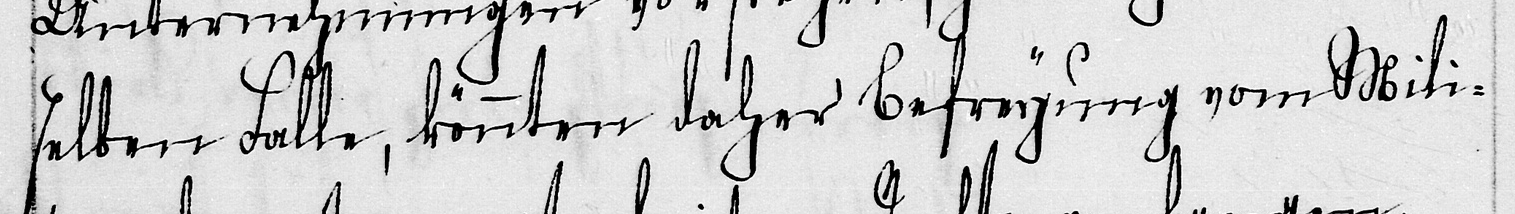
selben Falle, könnten daher Befreyung vom Mili¬
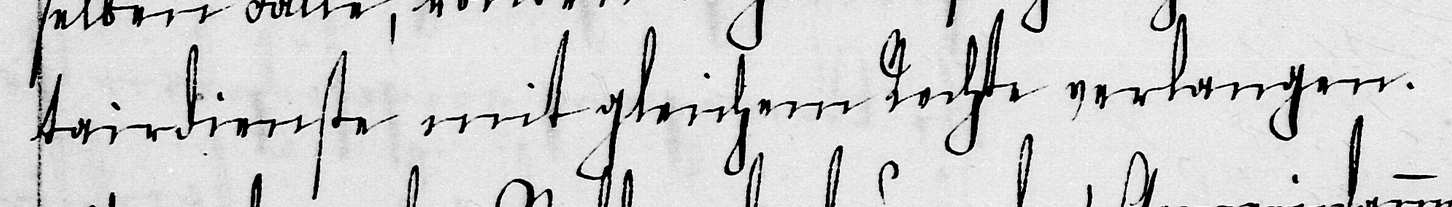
tairdienste mit gleichem Rechte verlangen.
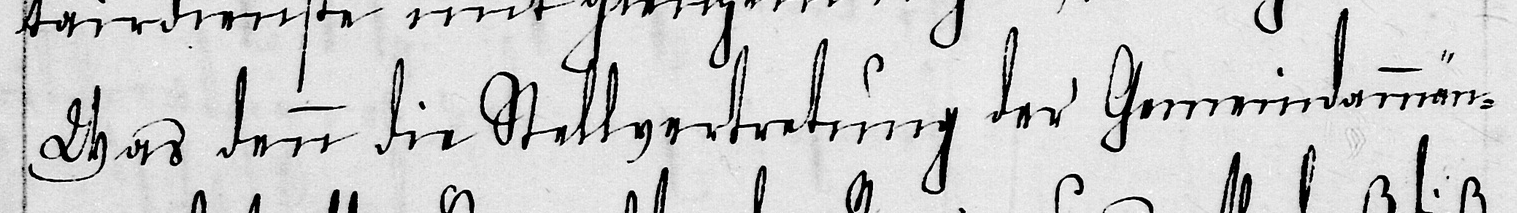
Was denn die Stellvertretung der Gemeindammän¬
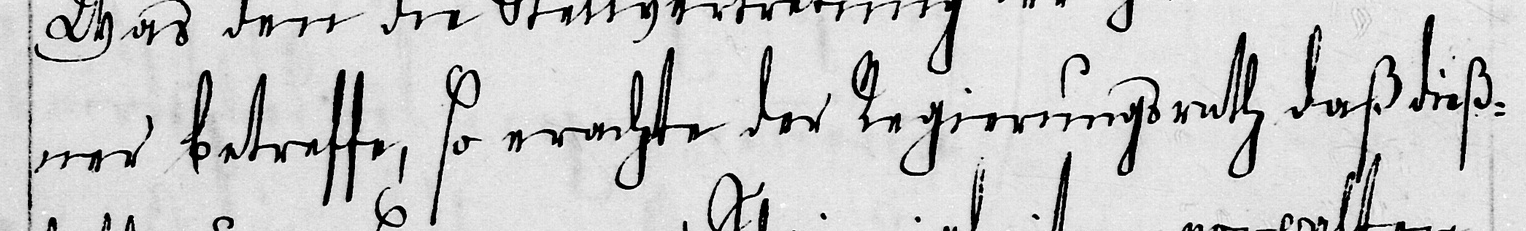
ner betreffe, so erachte der Regierungsrath daß dieß¬
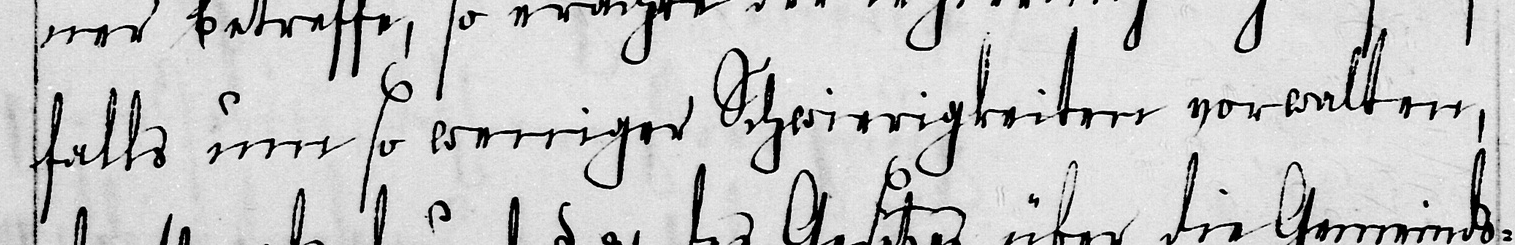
falls um so weniger Schwierigkeiten vorwalten,
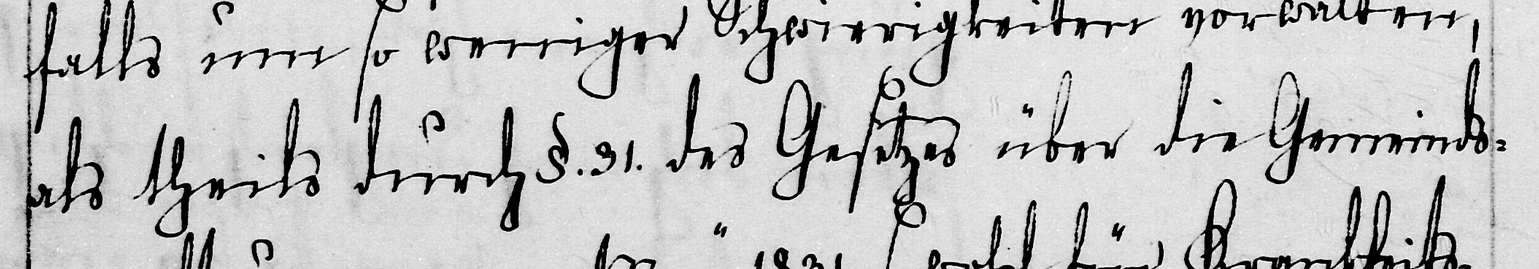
als theils durch §. 31. des Gesetzes über die Gemeinds¬
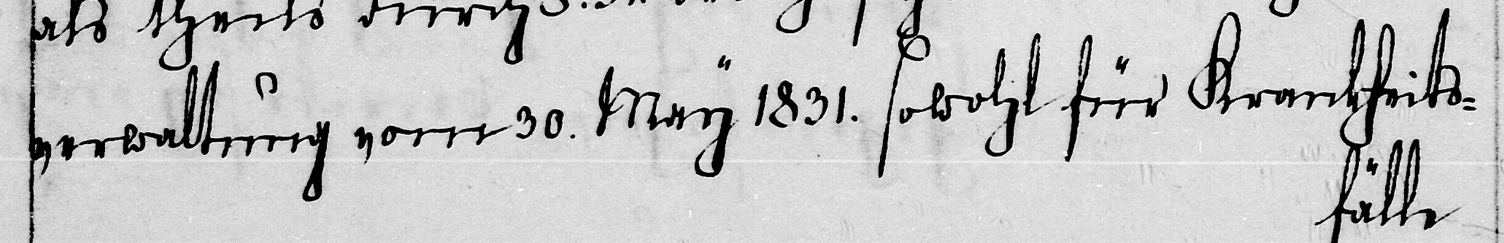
verwaltung vom 30. May 1831. sowohl für Krankheits-
